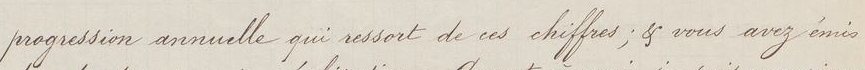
progression annuelle qui ressort de ces chiffres; & vous avez émis
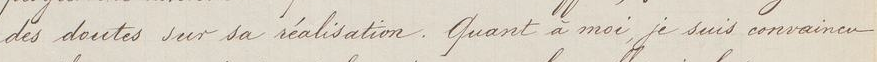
des doutes sur la réalisation. Quant à moi, je suis convaincu
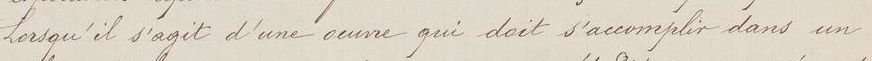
Lorsqu'il s'agit d'une oeuvre qui doit s'accomplir dans un
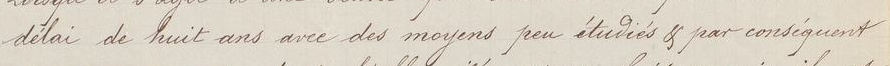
délai de huit ans avec des moyens peu étudiés & par conséquent
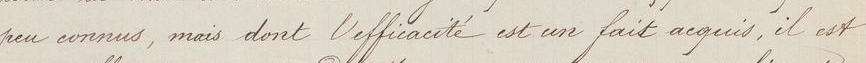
peu connus, mais dont l'efficacité est un fait acquis, il est
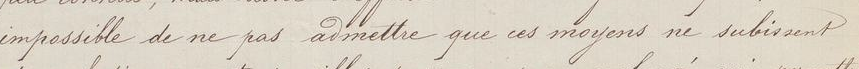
impossible de ne pas admettre que ces moyens ne subissent
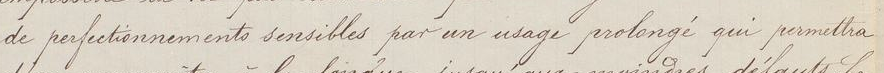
de perfectionnements sensibles par un usage prolongé qui permettra
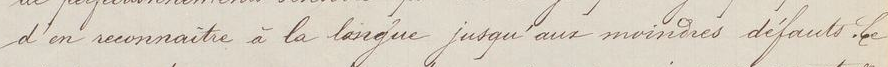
d'en reconnaitre à la longue jusqu'aux moindres défauts. Ce
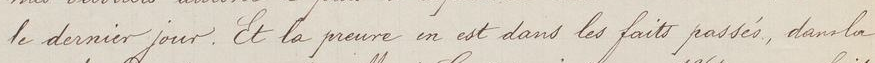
le dernier jour. Et la preuve en est dans les faits passés, dans la
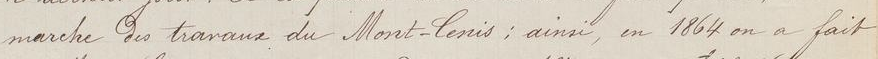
marche des travaux du Mont-Cenis; ainsi, en 1864 on a fait
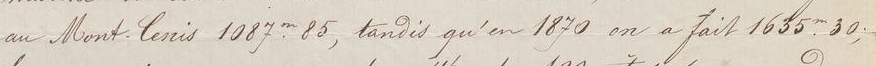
au Mont-Cenis 1087m 85, tandis qu'en 1870 on a fait 1635m 30;
